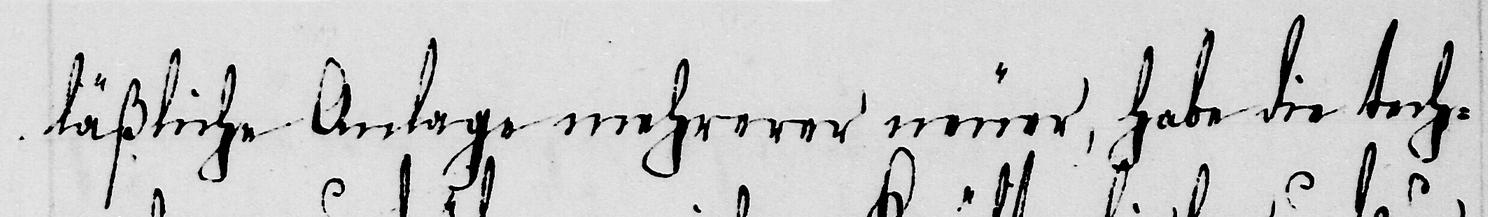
läßliche Anlage mehrerer neuer, habe die tech¬
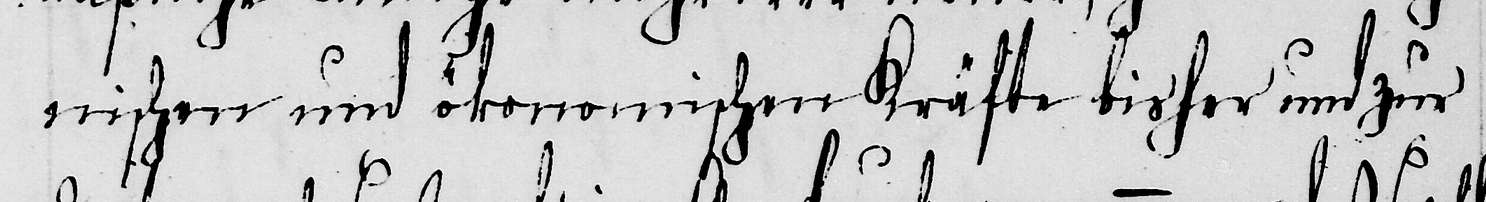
nischen und ökonomischen Kräfte bisher und zur
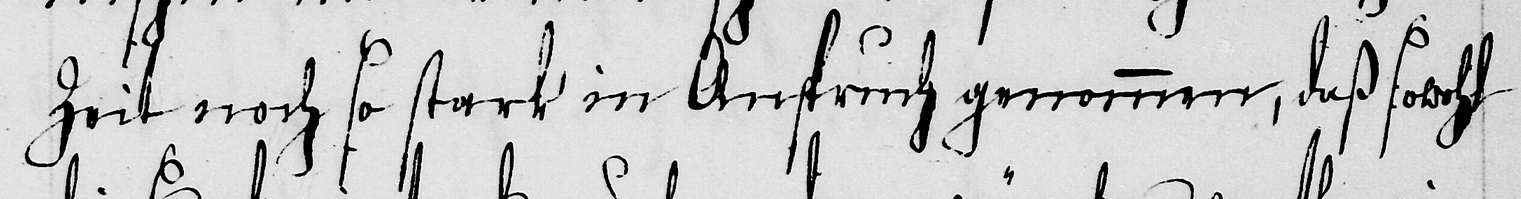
Zeit noch so stark in Anspruch genommen, daß sowohl
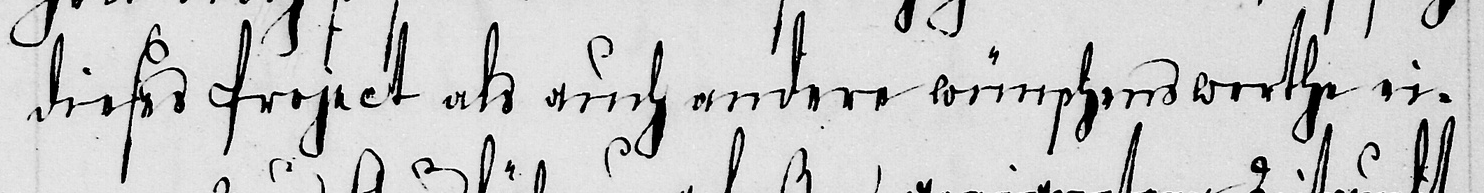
dieses Project als auch andere wünschenswerthe ei¬
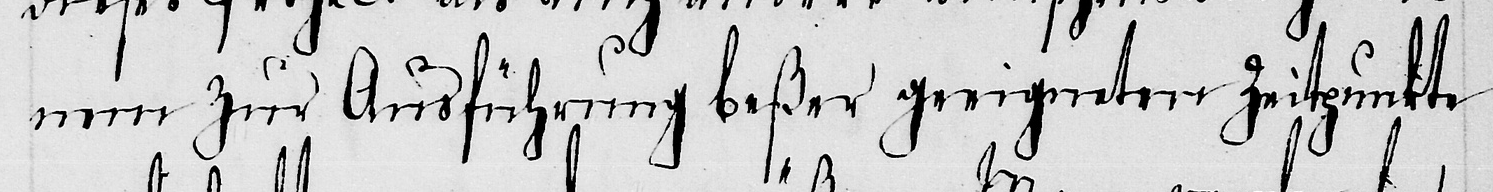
nem zur Ausführung beßer geeigneten Zeitpunkte
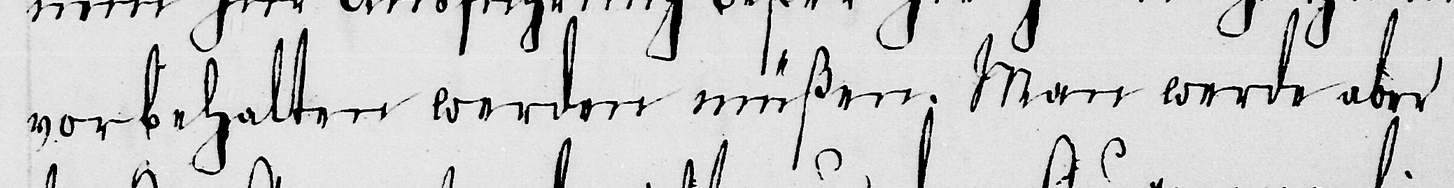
vorbehalten werden müßen. Man werde aber
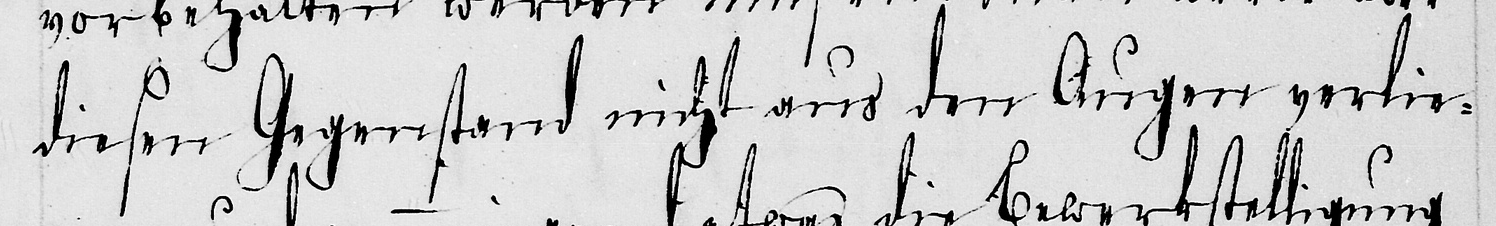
diesen Gegenstand nicht aus den Augen verlie¬
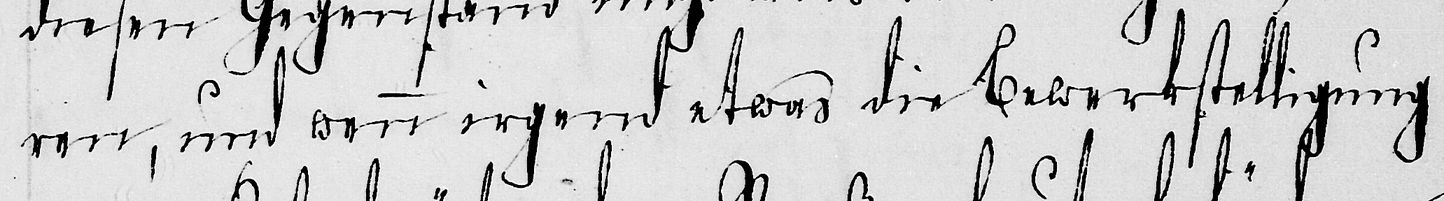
ren, und wenn irgend etwas die Bewerkstelligung
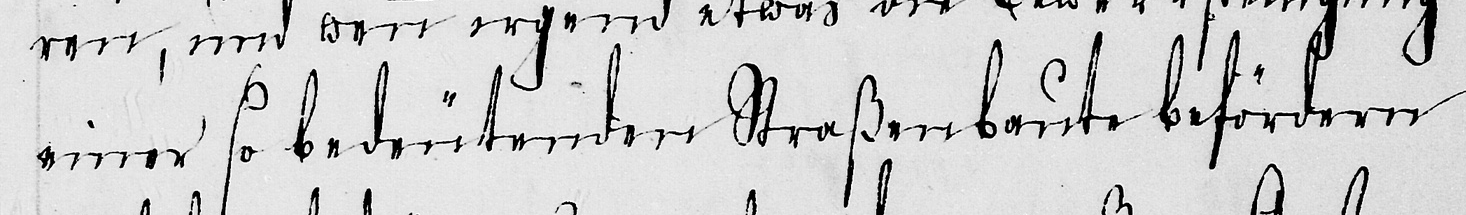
einer so bedeutenden Straßenbaute befördern
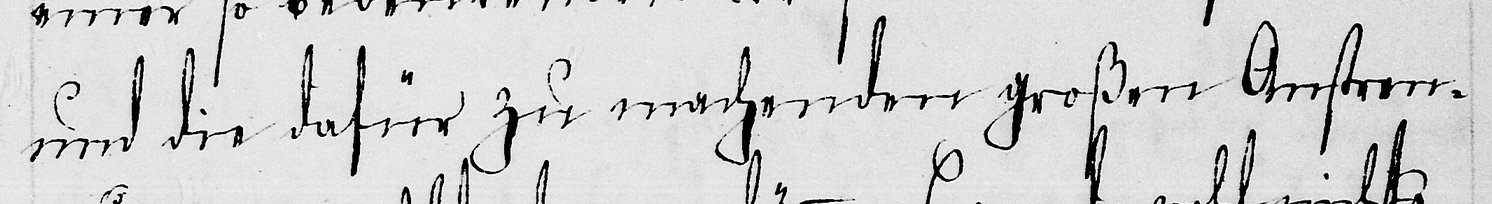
und die dafür zu machenden großen Anstren¬
